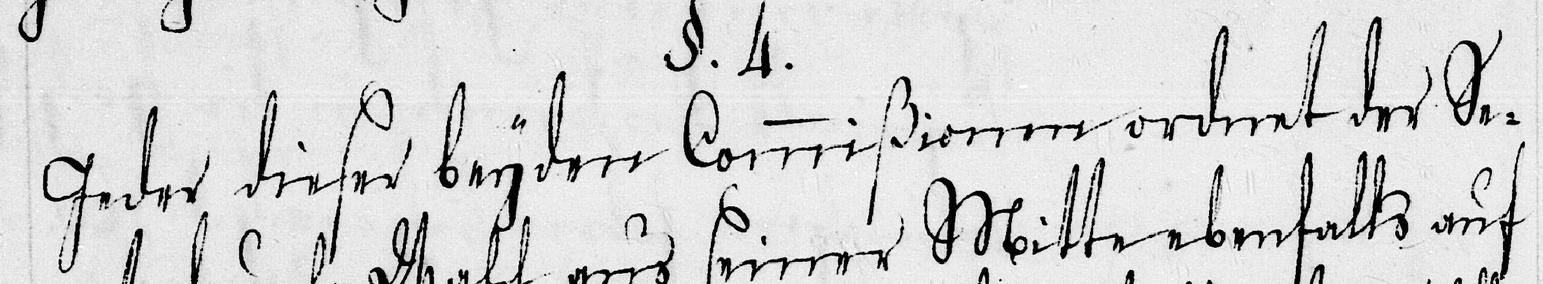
Jeder dieser beyden Commißionen ordnet der Se¬
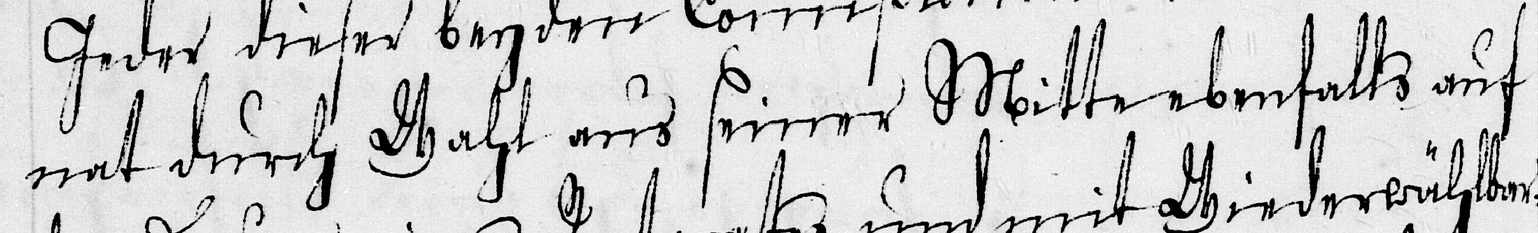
nat durch Wahl aus seiner Mitte ebenfalls auf
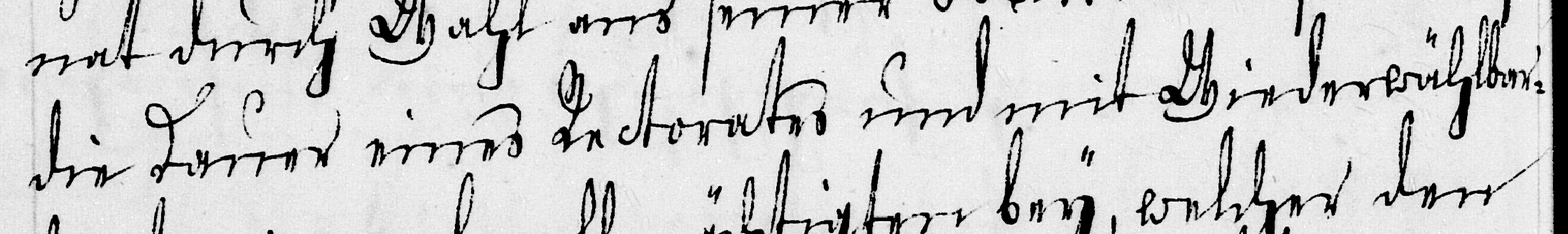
die Dauer eines Rectorates und mit Wiederwählbar¬
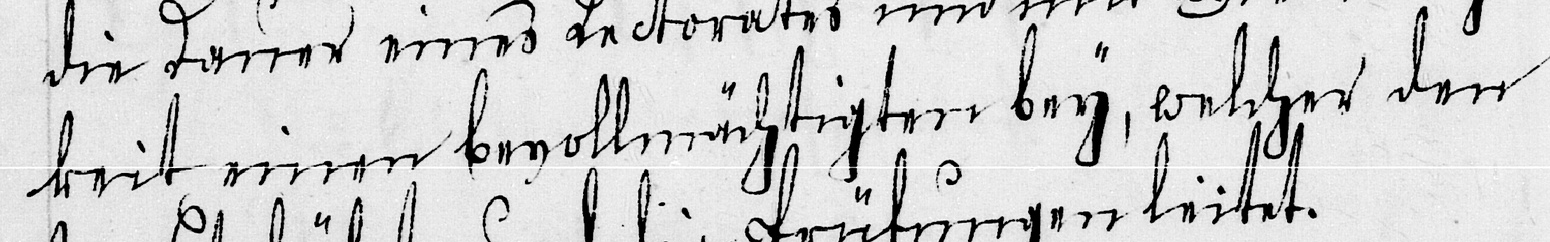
keit einen Bevollmächtigten bey, welcher den
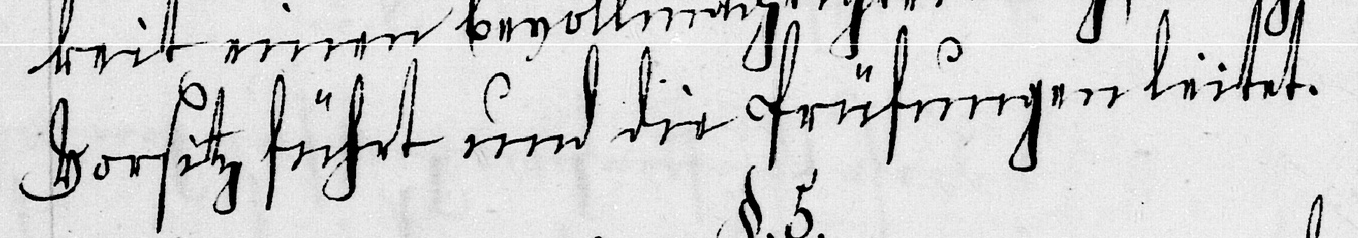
Vorsitz führt und die Prüfungen leitet.
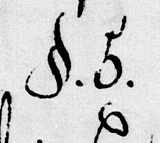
§. 5.
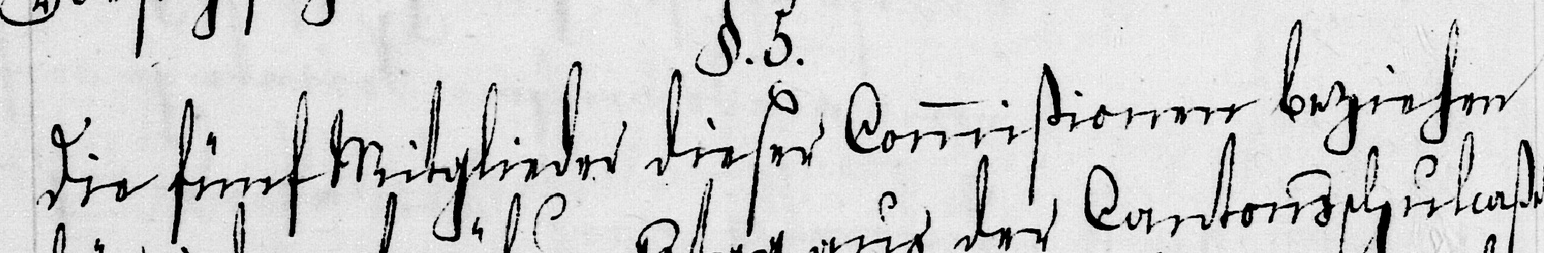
Die fünf Mitglieder dieser Commißionen beziehen
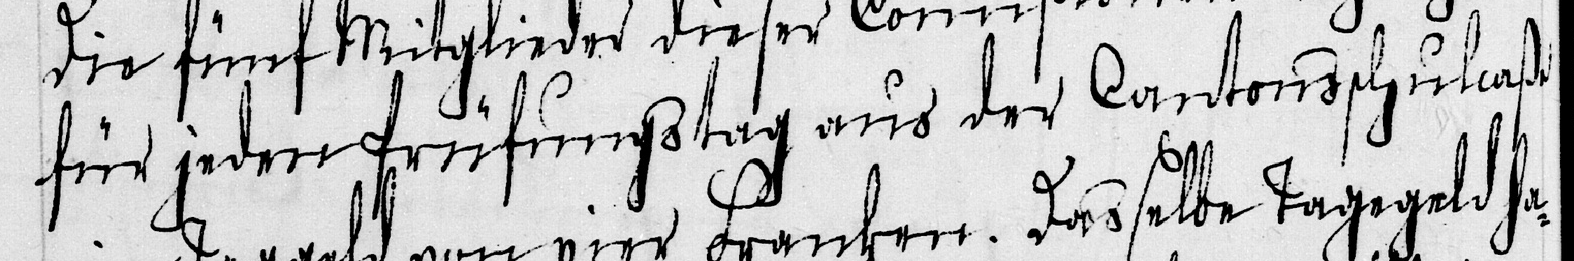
für jeden Prüfungstag aus der Cantonsschulcaße
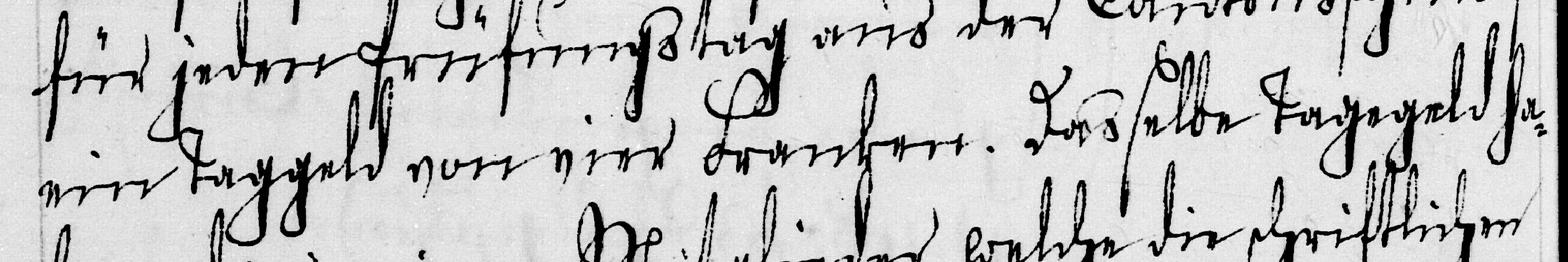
ein Taggeld von vier Franken. Dasselbe Tagegeld ha¬
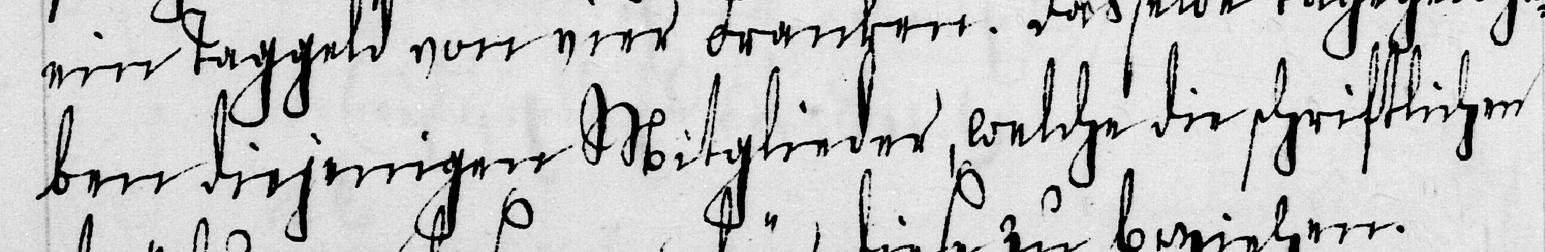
ben diejenigen Mitglieder, welche die schriftlich¬
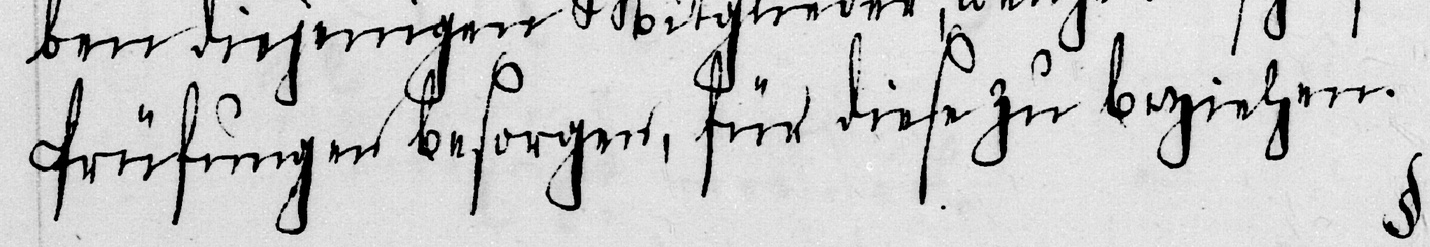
Prüfungen besorgen, für diese zu beziehen.
